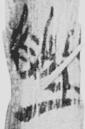○（頸）
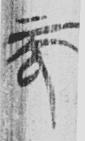而
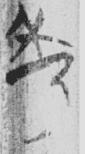秀
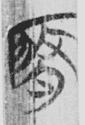○（肩）
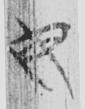母
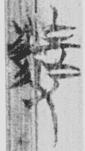○（廢）
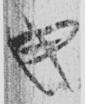母
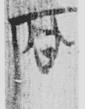痌
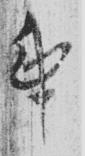身
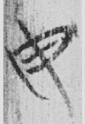母
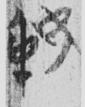○（偃）
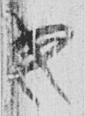母
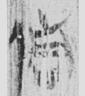倩（靜）
